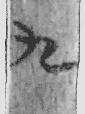九
